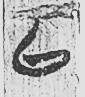㠯（以）
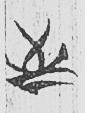至
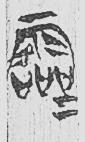霝=
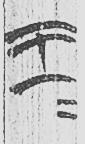王=
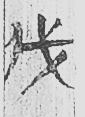伐
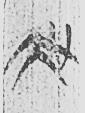吳
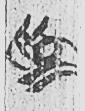爲
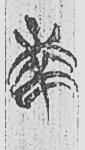南
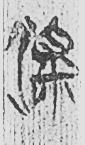{水眔}
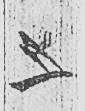之
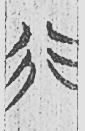行
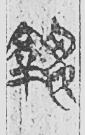執
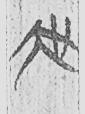吳
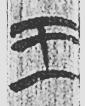王
